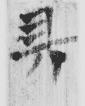𡵂
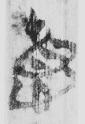惪
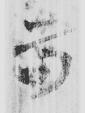可
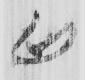㠯（以）
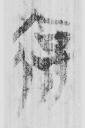{宀保}
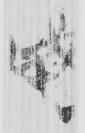成
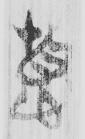惪
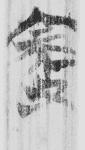{宀卞又}
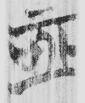亟
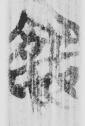執
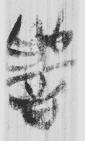譌
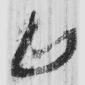㠯（以）
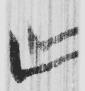亡
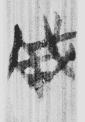成
